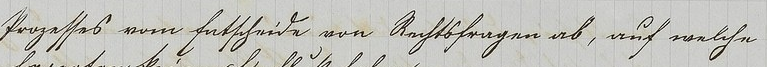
Prozesses vom Entscheide von Rechtsfragen ab, auf welche
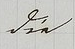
die
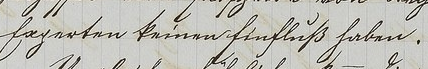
Experten keinen Einfluß haben. –
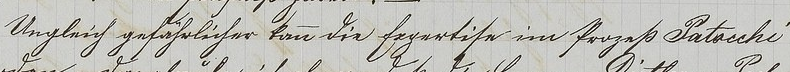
Ungleich gefährlicher kann die Expertise im Prozeß Patocchi
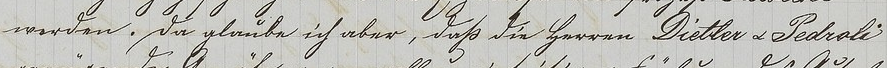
werden. Da glaube ich aber, daß die Herren Dietler & Pedroli
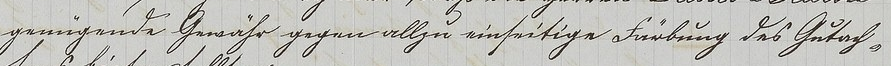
genügende Gewähr gegen allzu einseitige Färbung des Gutach-
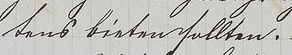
tens bieten sollten. –
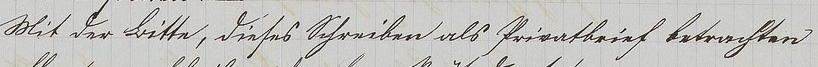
Mit der Bitte, dieses Schreiben als Privatbrief betrachten
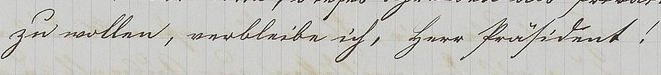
zu wollen, verbleibe ich, Herr Präsident!
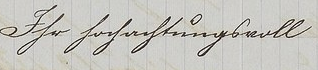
Ihr hochachtungsvoll
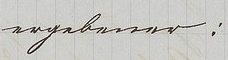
ergebener:
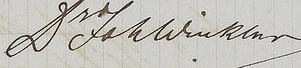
Dr Joh Winkler
